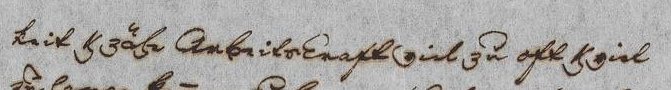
keit & zähe Arbeitskraft viel zu oft & viel
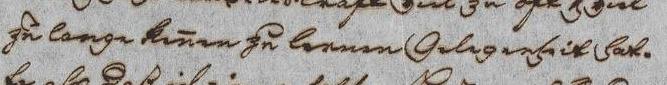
zu lange kennen zu lernen die Gelegenheit hat-
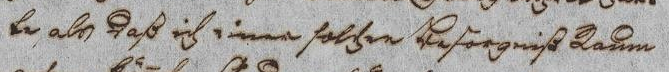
te, als daß ich einer solchen Besorgniß Raum
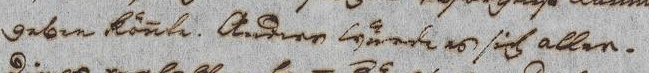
geben könnte. Anders würde es sich aller-
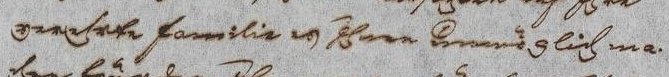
verehrte Familie es Ihnen unmöglich ma-
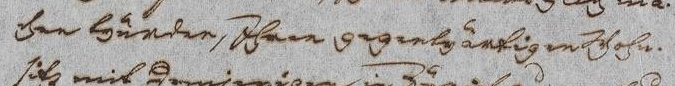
chen würden, Ihren gegenwärtigen Wohn-
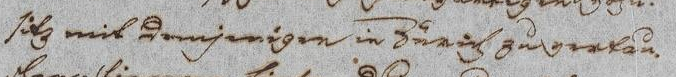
sitz mit demjenigen in Zürich zu vertau-
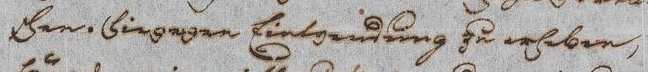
schen. Hiegegen Einwendung zu erheben,
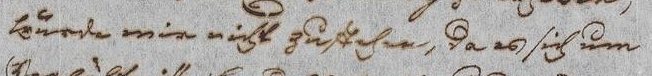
würde mir nicht zustehen, da es sich um
